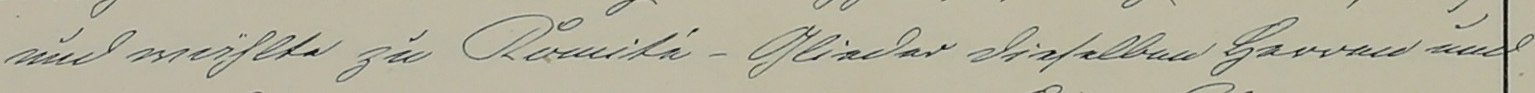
und wählte zu Komité-Glieder dieselben Herren und
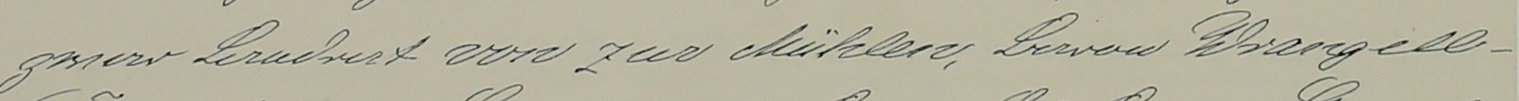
zwar Landrat von zur Mühlen, Baron Wrangell-
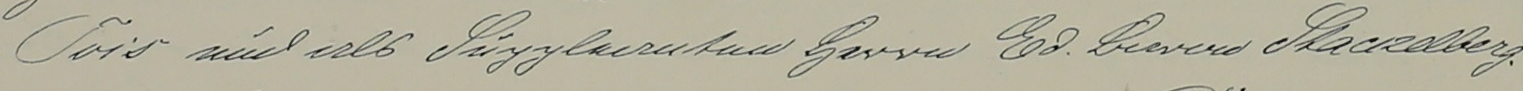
Tois und als Suppleanten Herrn Ed. Baron Stackelberg.
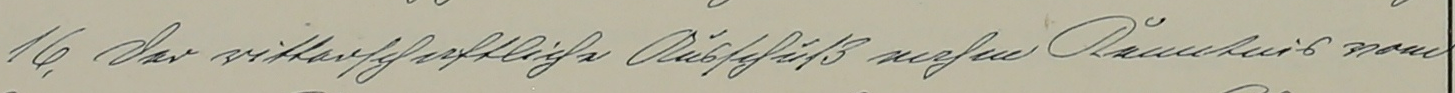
16. Der ritterschaftliche Ausschuß nahm Kenntnis vom
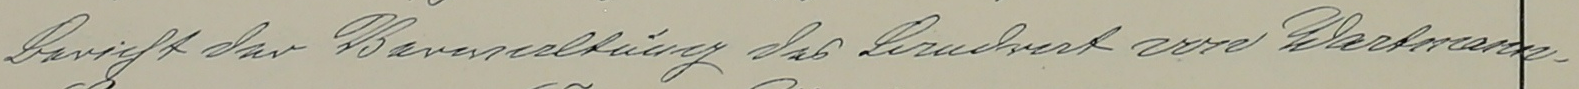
Bericht der Verwaltung des Landrat von Wartmann-
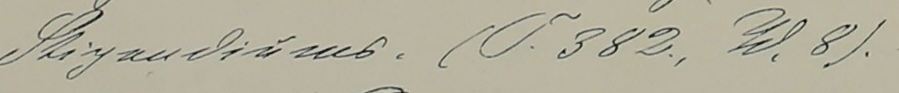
Stipendiums. (T.382; W.8).
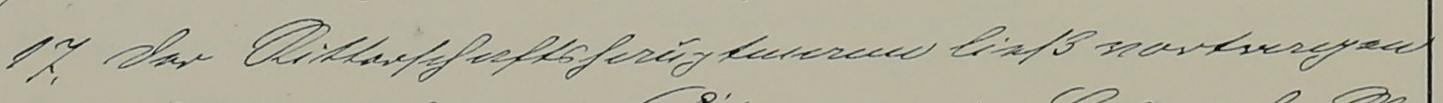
17. Der Ritterschaftshauptmann ließ vortragen
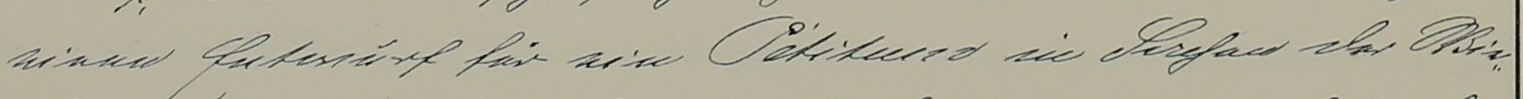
einen Entwurf für ein Petitum in Sachen der Wie-
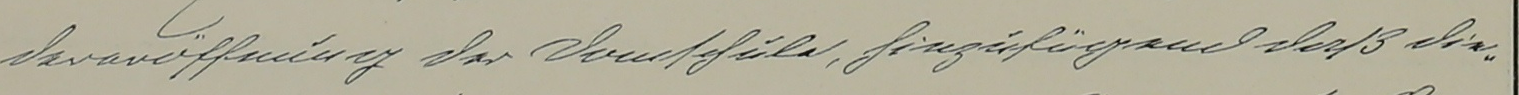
dereröffnung der Domschule, hinzufügend, daß die-
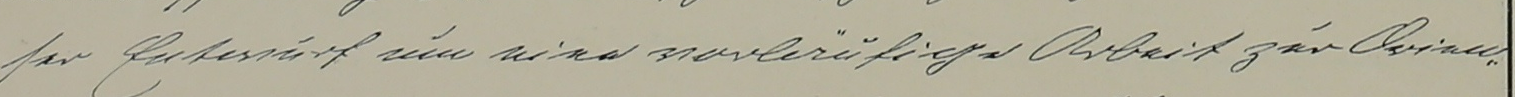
ser Entwurf nur eine vorläufige Arbeit zur Orien-
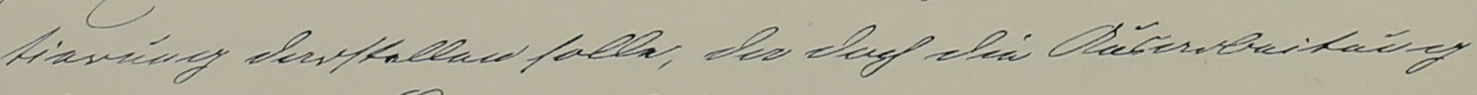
tierung darstellen solle, da doch die Ausarbeitung
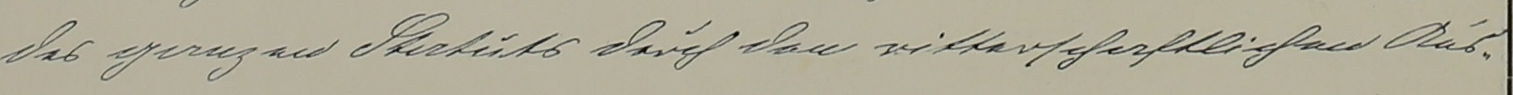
des ganzen Statuts durch den ritterschaftlichen Aus-
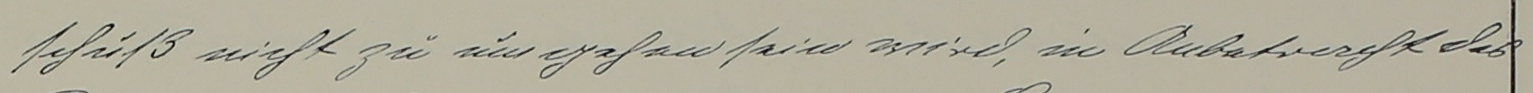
schuß nicht zu umgehen sein wird, in Anbetracht des
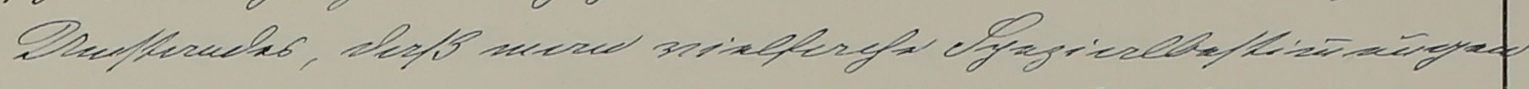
Umstandes, daß man vielfache Spezialbestimmungen
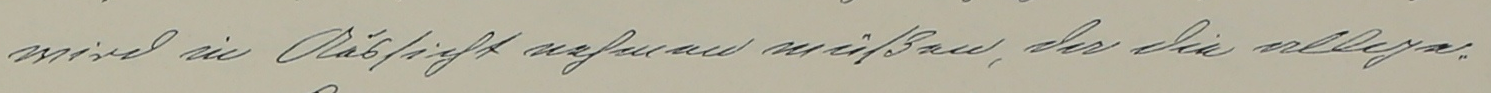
wird in Aussicht nehmen müßen, da die allge-
